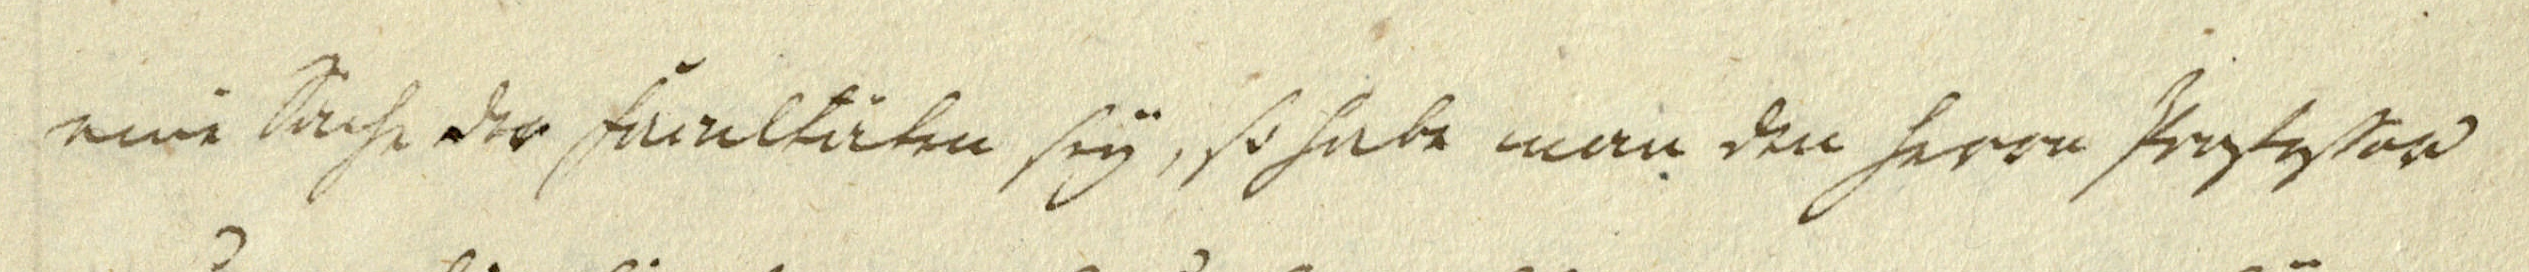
eine Sache der Facultäten seÿ, so habe man den Herrn Professor
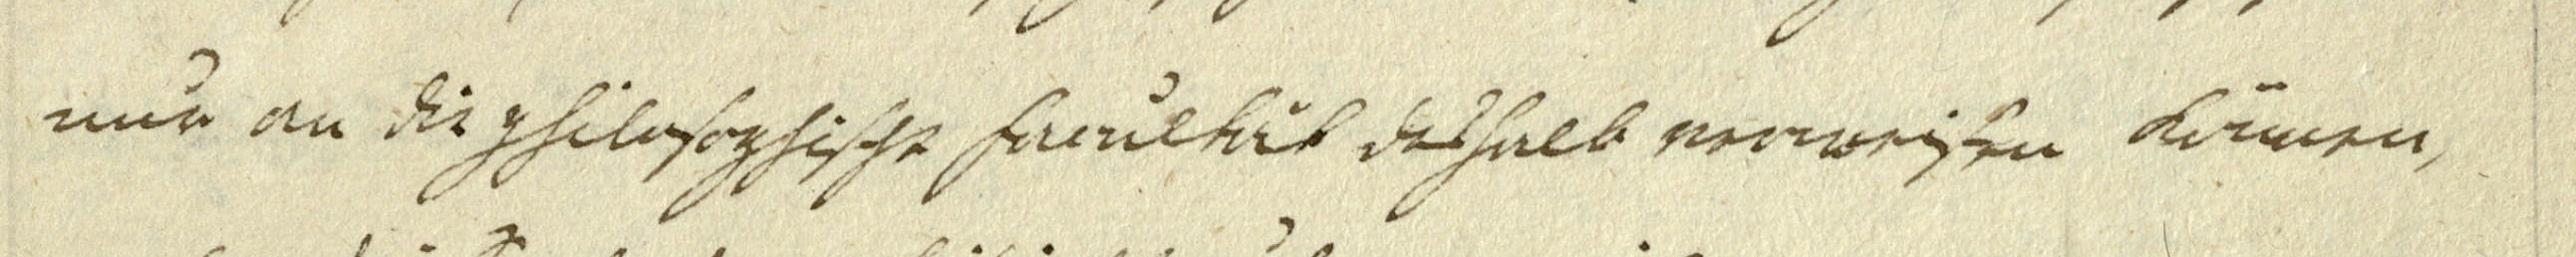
nur an die philosophische Facultät deshalb verweisen können,
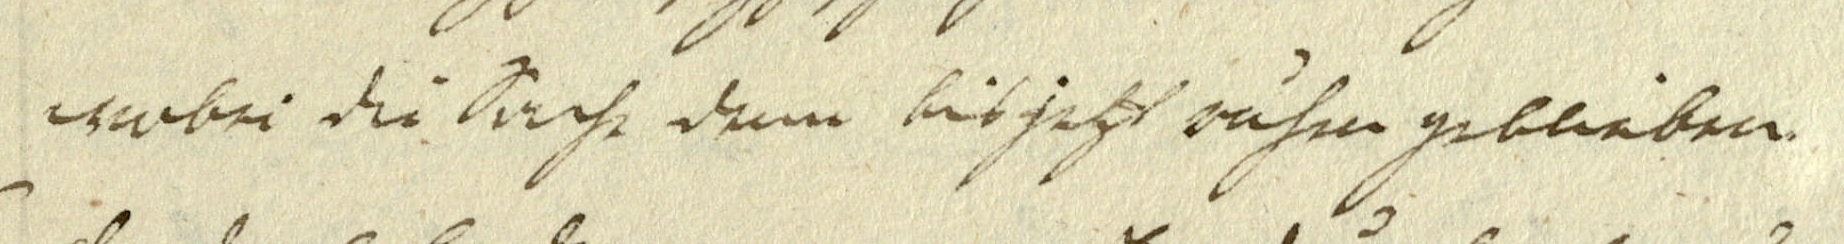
wobei die Sache denn bis jetzt ruhen geblieben.
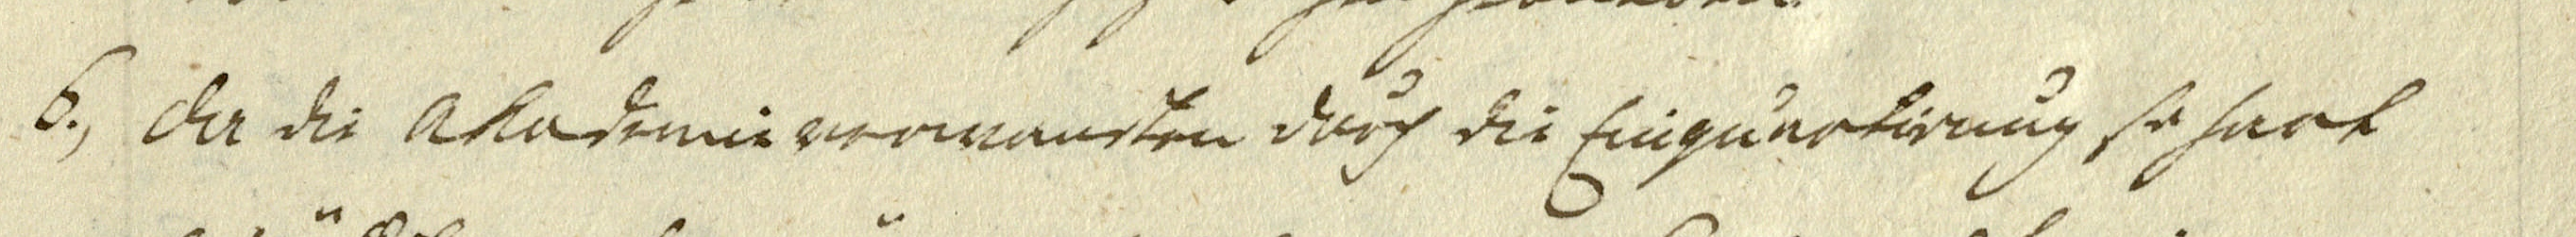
6., Da die Akademieverwandten durch die Einquartirung so hart
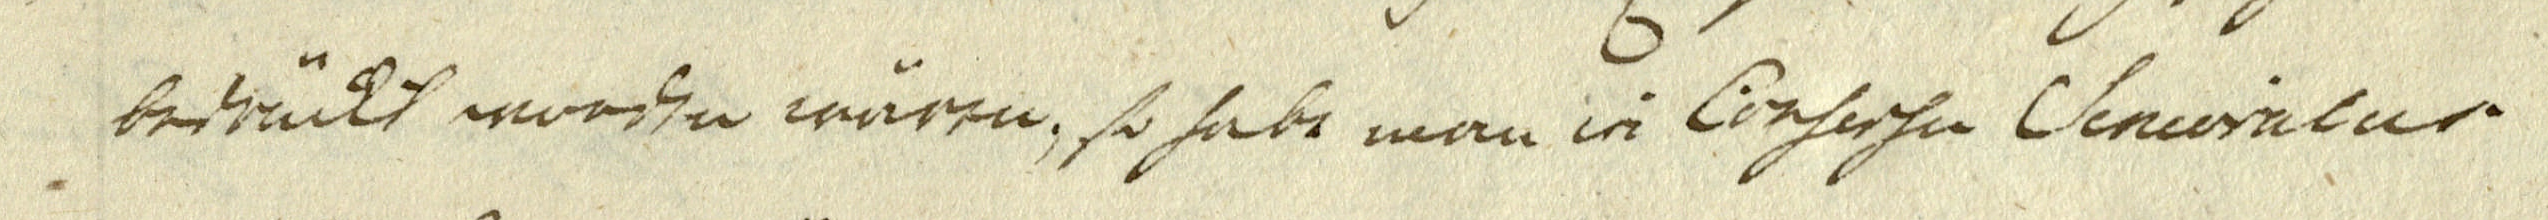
bedrückt worden wären, so habe man in Consessu Senioratus
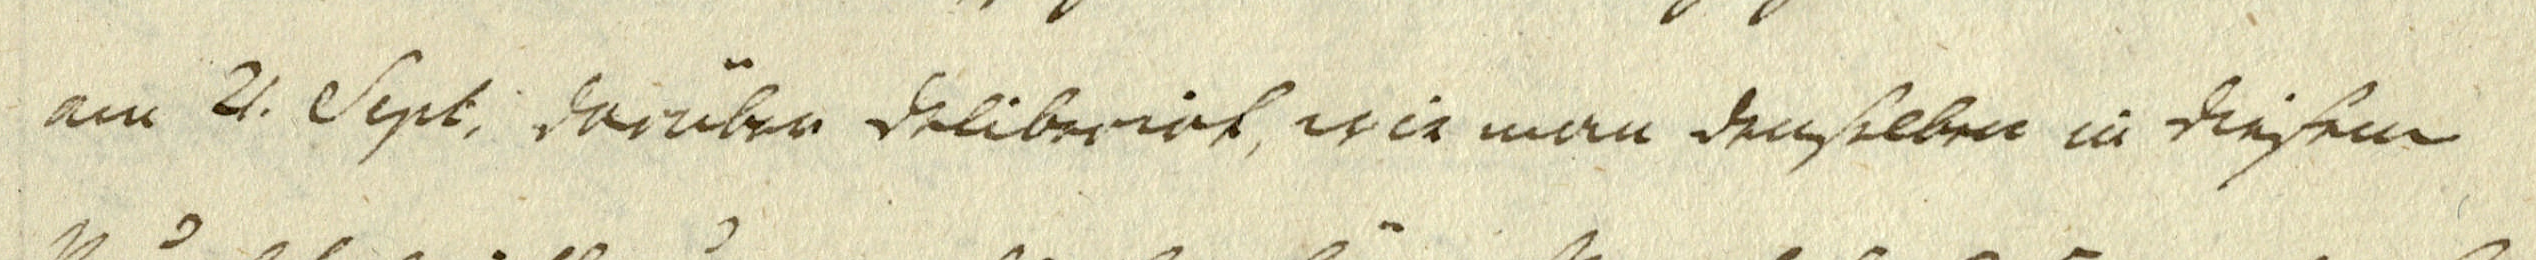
am 21. Sept, darüber deliberirt, wie man demselben in diesem
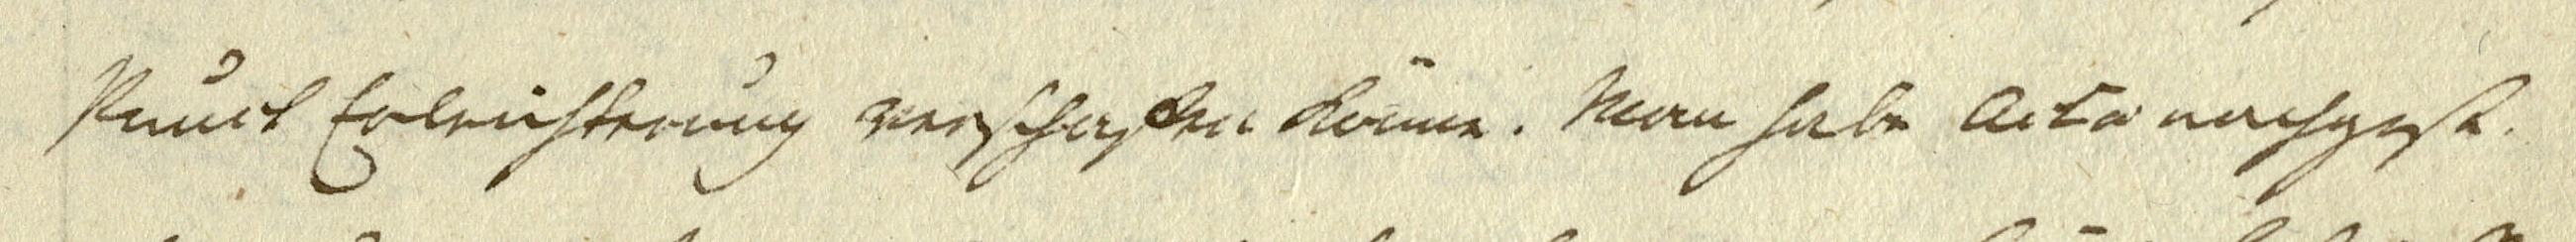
Punct Erleichterung verschaffen könne. Man habe Acta nachgese¬
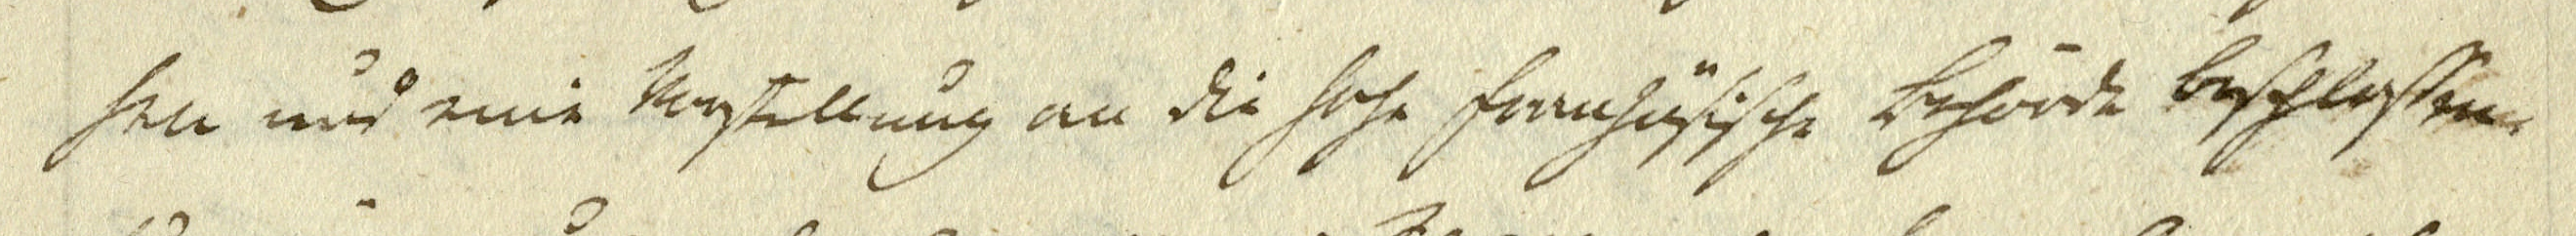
hen und eine Vorstellung an die hohe Französische Behörde beschlossen.
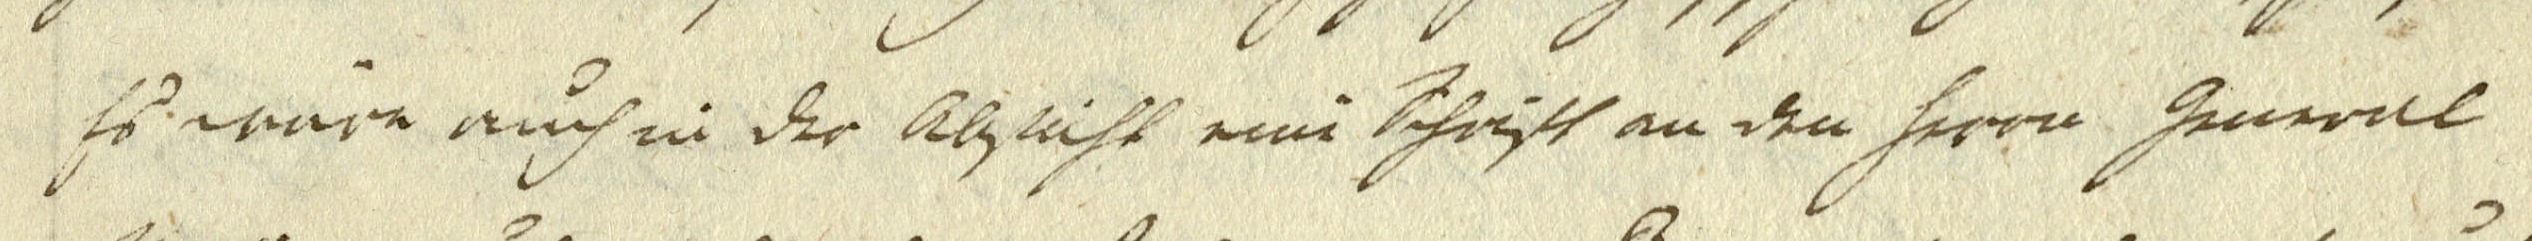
Es wäre auch in der Absicht eine Schrift an den Herrn General
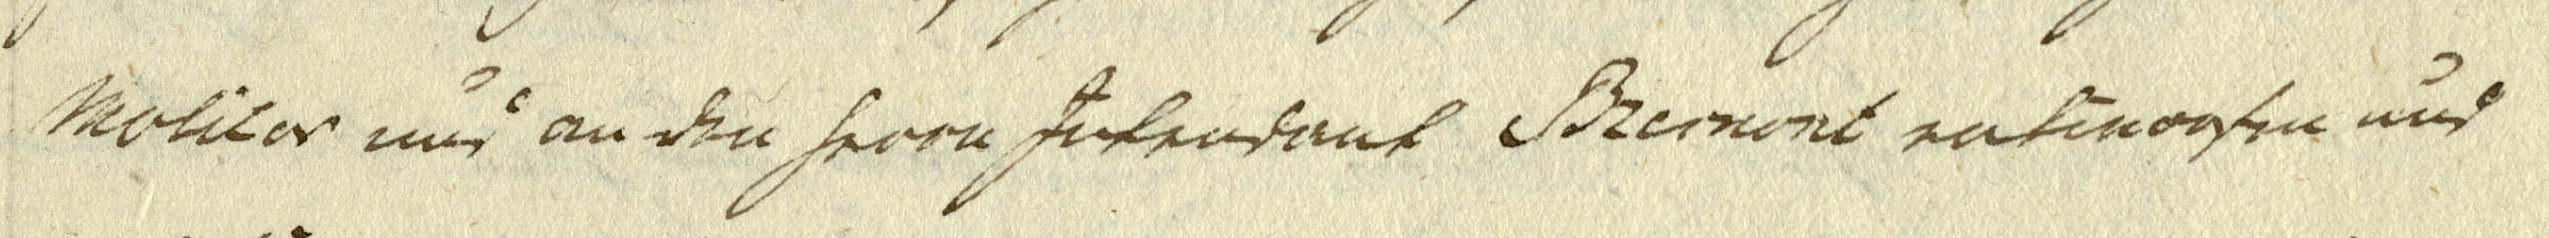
Molitor und an den Herrn Intendant Bremont entworfen und
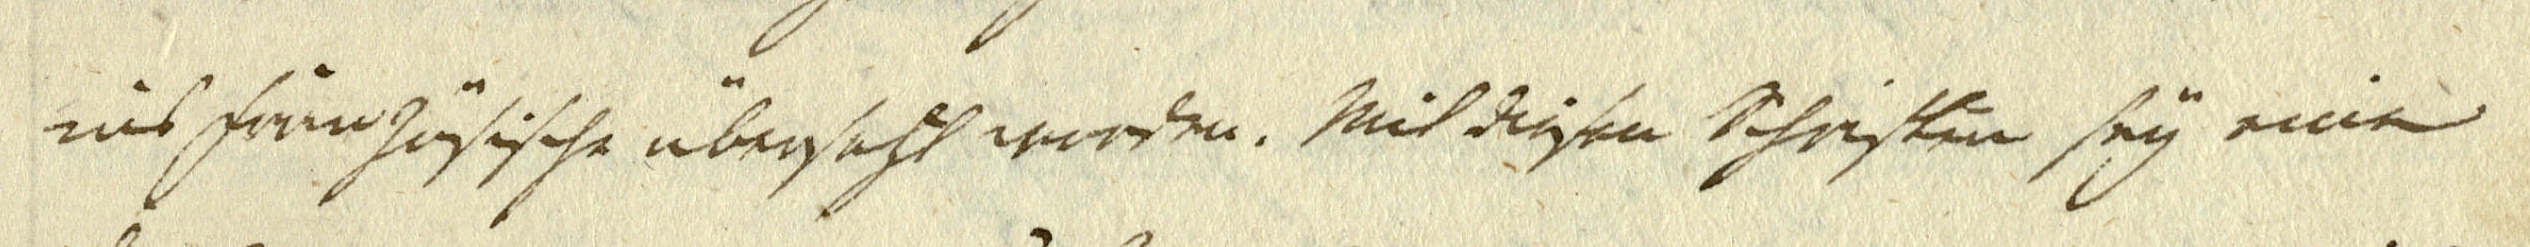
ins Französische übersetzt worden. Mit diesen Schriften seÿ eine
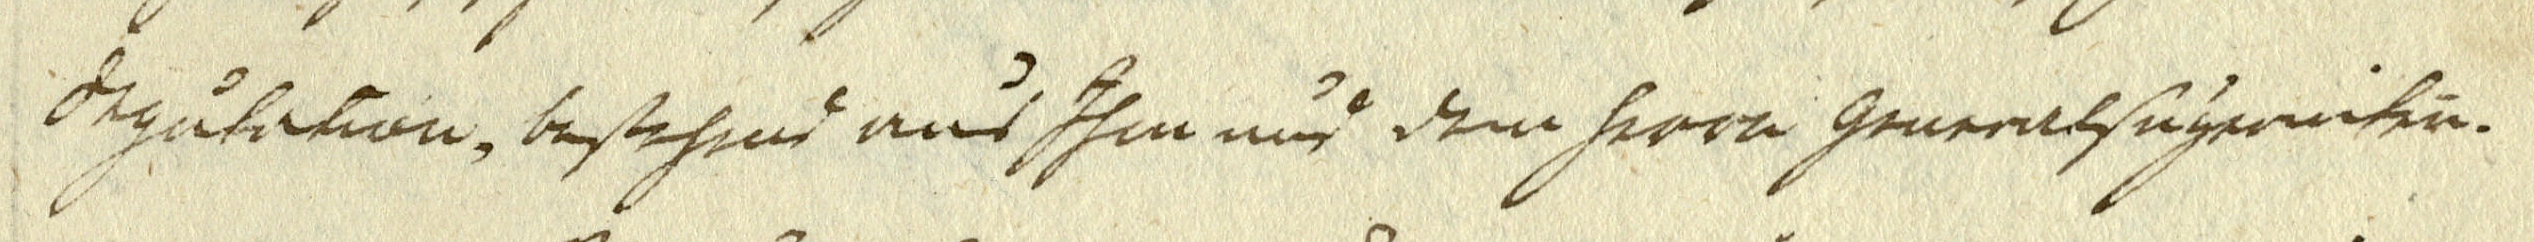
Deputation, bestehend aus Ihm und dem Herrn Generalsuperinten¬
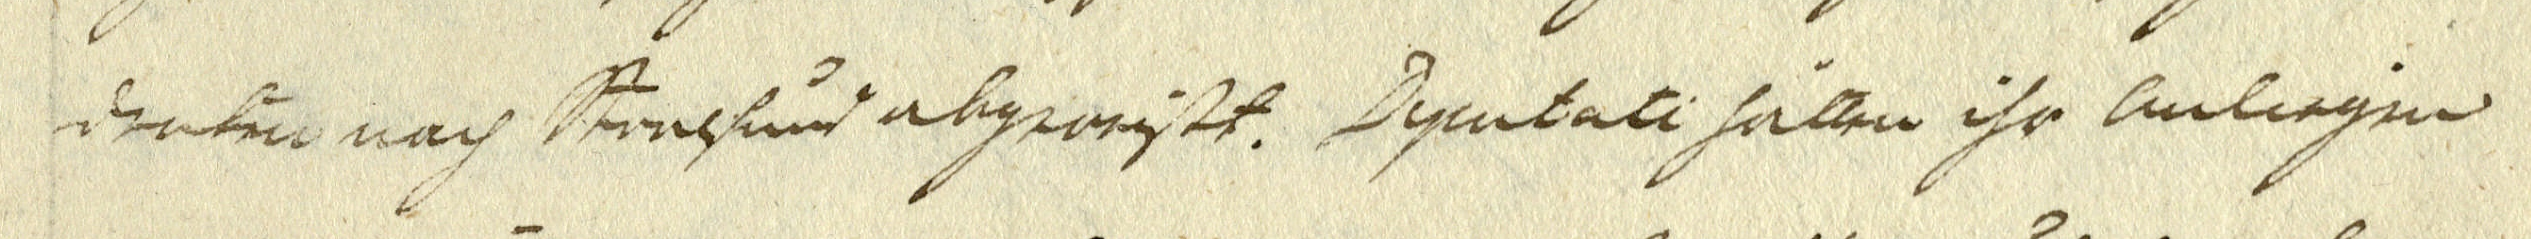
denten nach Stralsund abgereist. Deputati hätten ihr Anliegen
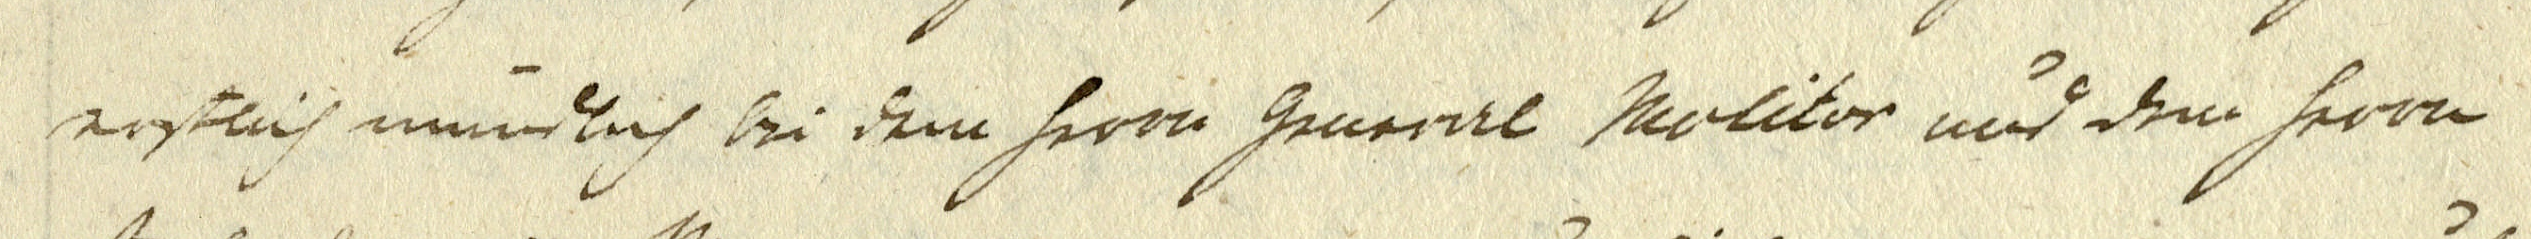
erstlich mündlich bei dem Herrn General Molitor und dem Herrn
